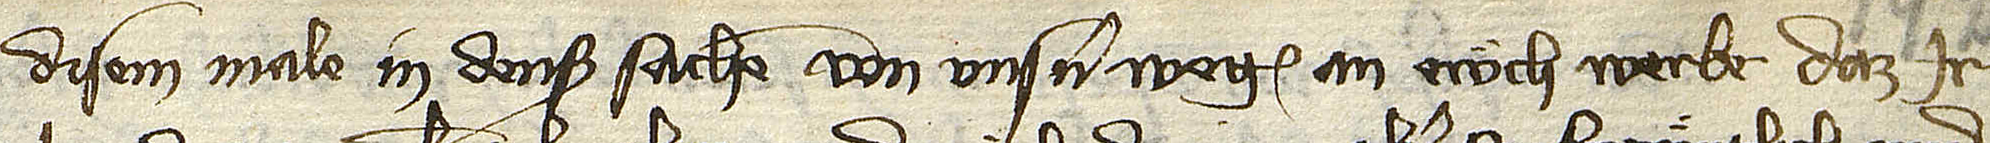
diſem male in denſ* ſache* von vnſ*n weg* an ewch werbe daʒ Ir
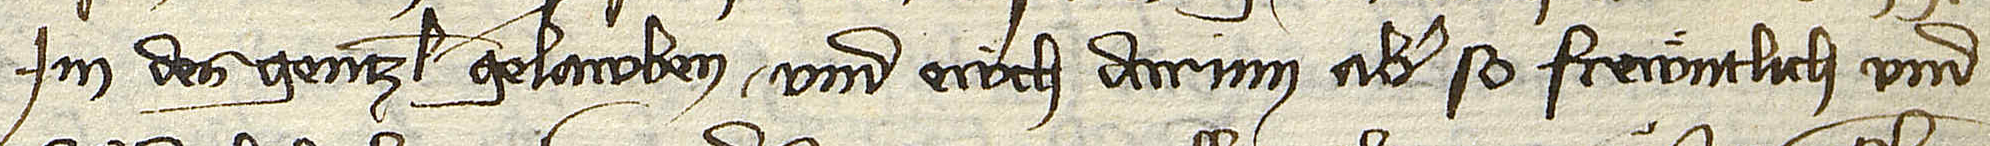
Im des gencʒl* gelawben / vnd ewch darinn ab* ſo frewntlich vnd
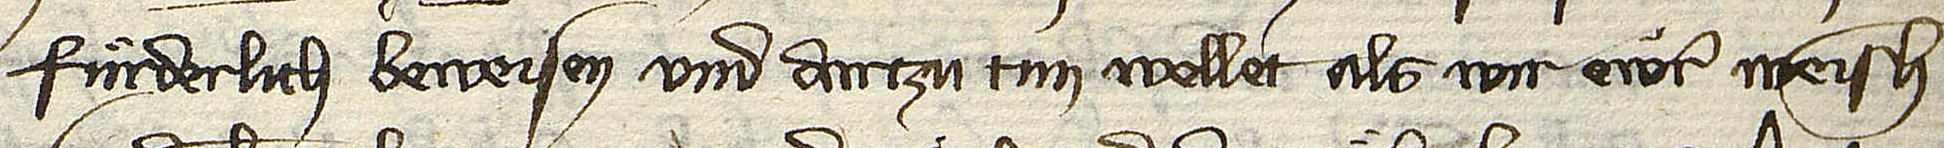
fürderlich beweiſen vnd darcʒu tun wellet als wir ew*r weiſh*
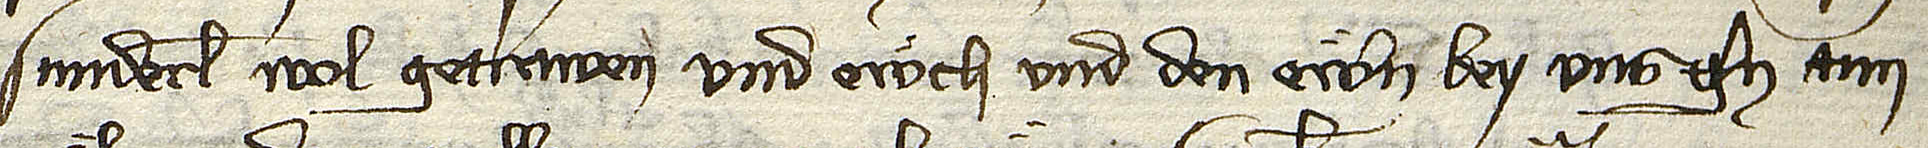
ſunderl* wol getrawen vnd ewch vnd den ew*n bey vns g*n tun
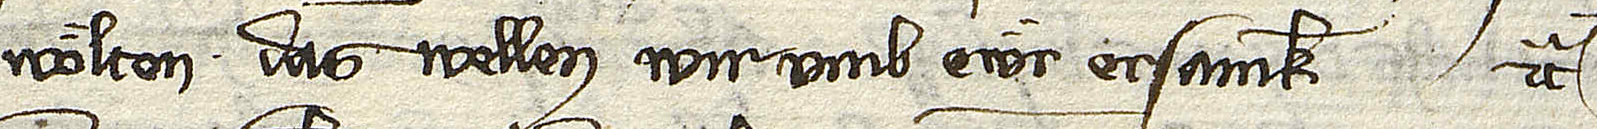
wölten . das wellen wir vmb ewr erſamk* ec*
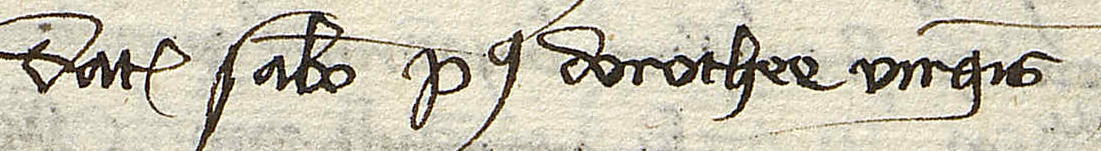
Dat* ſabo* p* dorothee virg*is
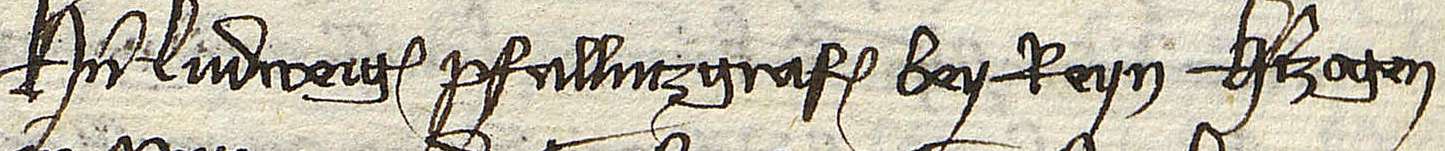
H*n ludweig* pfallncʒgraf* bey Reyn H*cʒogen
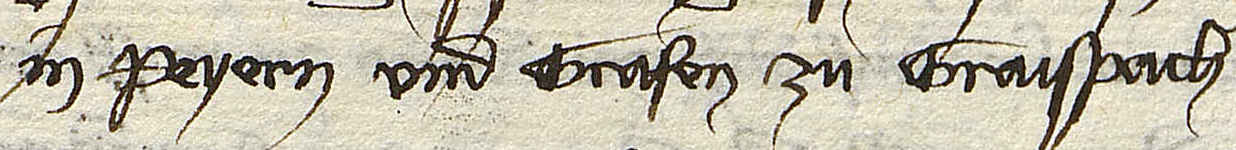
in Peyern vnd Grafen cʒu Graiſpach
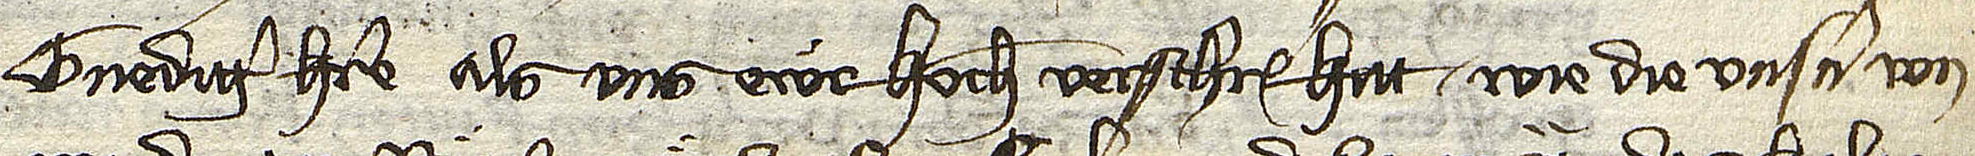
Gnedig* h*re als vns ew*r hoch* verſchr* hat / wie die vnſ*n von
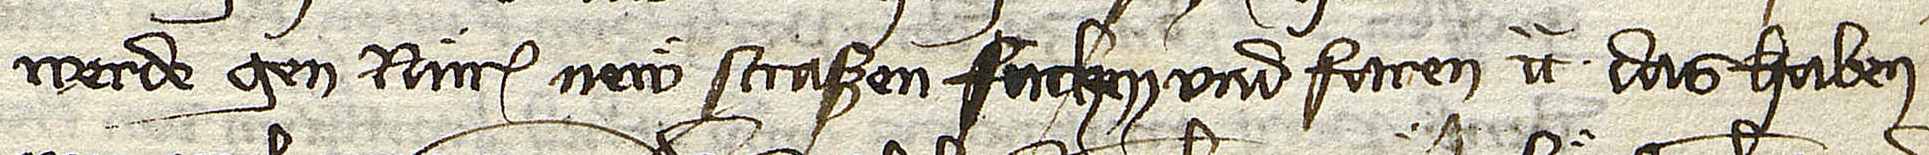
werde gen Nür* new ſtraſʒen ſuchen vnd faren ec* das haben
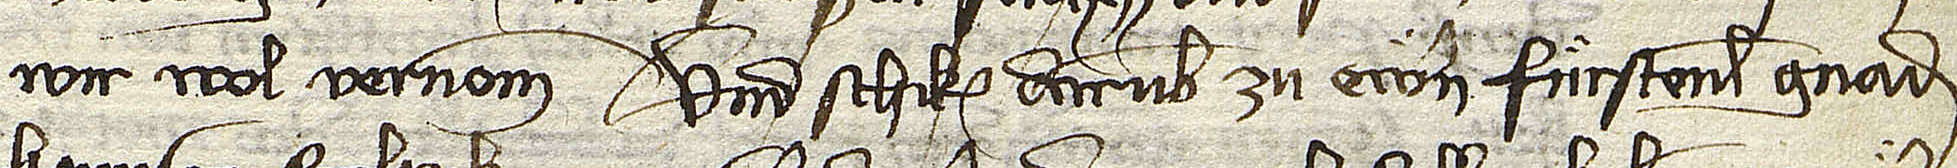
wir wol vernom* / Vnd ſchik* daru*b ʒu ew*n fürſtenl* gnad*
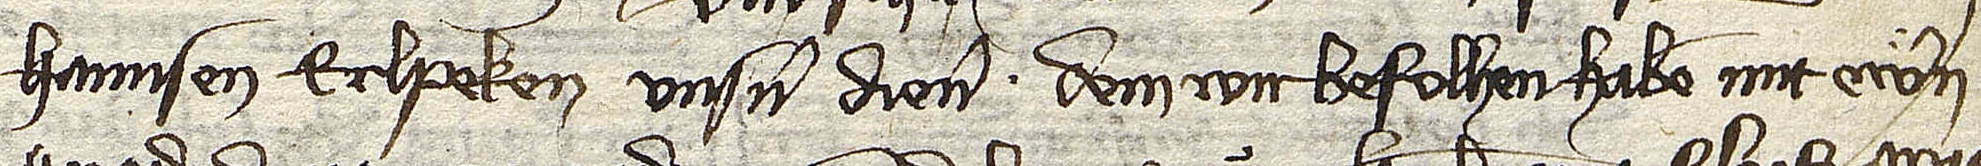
hannſen Erlpeken vnſ*n dien* . dem wir befolhen habe* mit ew*n
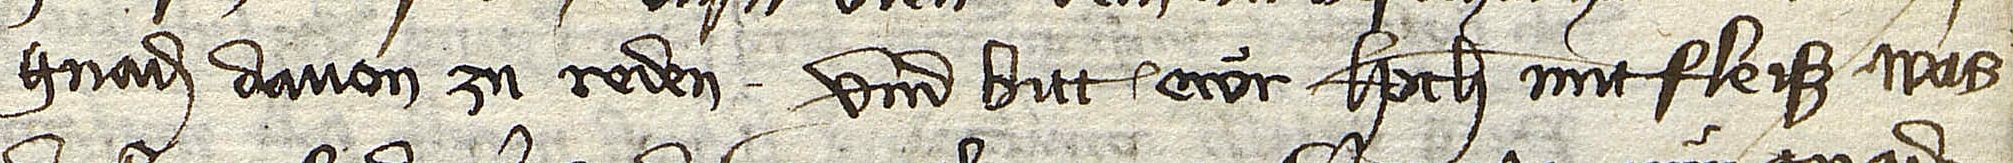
gnad* dauon ʒu reden . Vnd bitt* ewr hoch* mit fleiſʒ . was
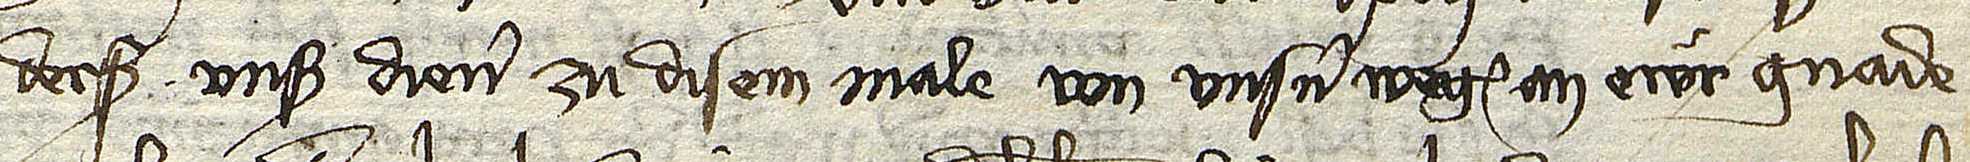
derſ* . vnſ* dien* ʒu diſem male von vnſ*n weg* an ewr gnade
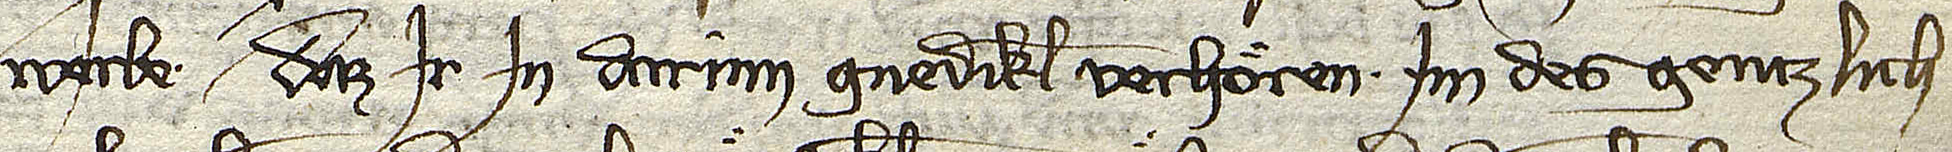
werbe . / Daʒ Ir In darinn gnedikl* verhören . Im des gencʒlich
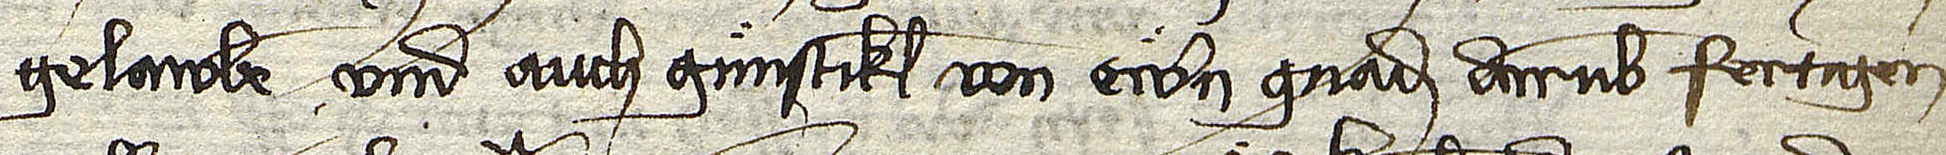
gelawbe* vnd auch günſtikl* von ew*n gnad* daru*b fertigen
